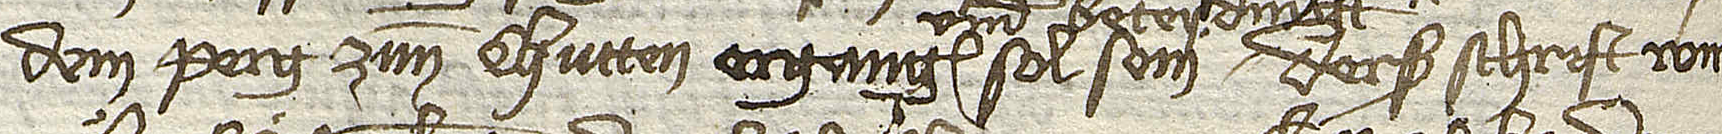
dem perg ʒun* Chutten ergang* ſol ſein / Derſ* ſchrift wir
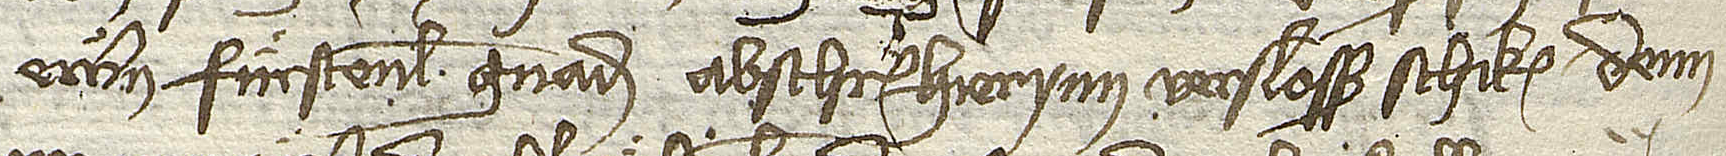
ew*n fürſtenl* gnad* abſchr* hierynn verſloſſ* ſchik* / denn
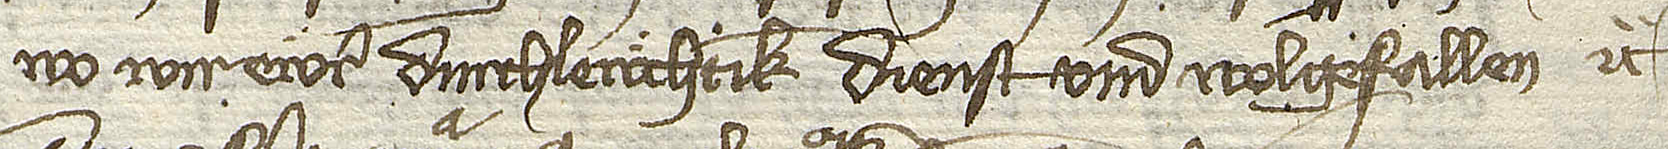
wo wir ew*r durchlewchtik* dienſt vnd wolgefallen ec*
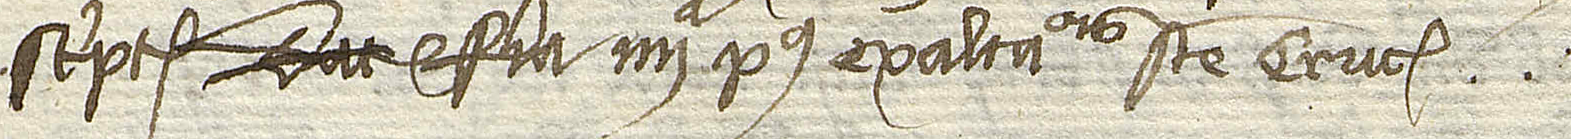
ſt*pt* Dat* fia* iiii* p* exalta* ſte* Cruc* . .
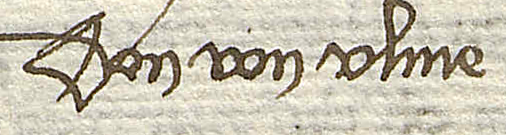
Den von vlme
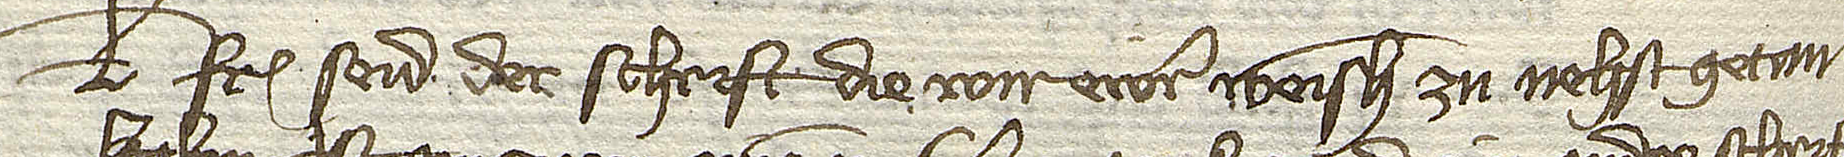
L* fr* ſeid der ſchrift die wir ewr* weiſh* ʒu nehſt getan
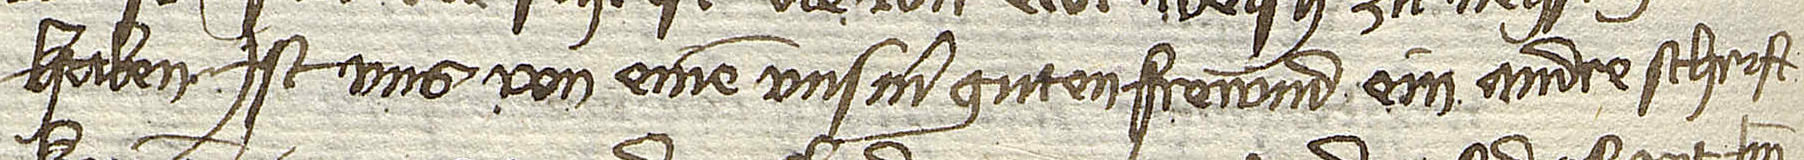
haben . Iſt vns von eine* vnſ*m guten frewnd ein andre ſchrift
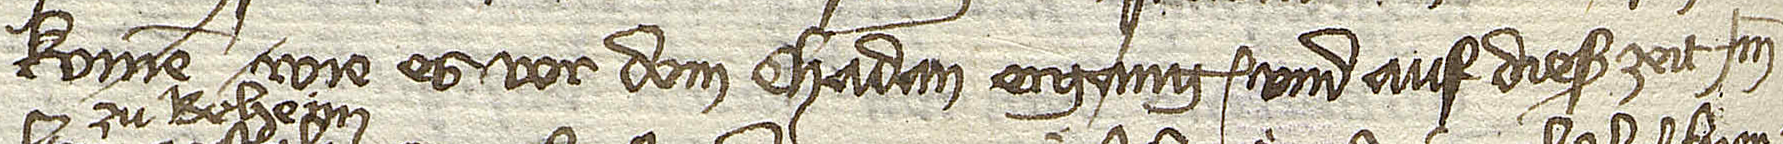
kome* / wie es vor dem Chadan ergang* vnd auf dieſ* ʒeit Im*
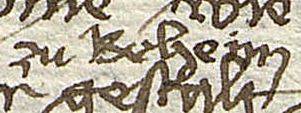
ʒu Beheim
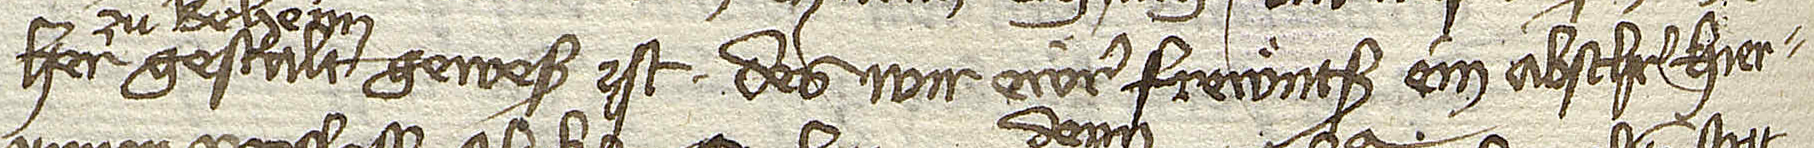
her geſtalt geweſ* iſt . des wir ewr* frewntſ* ein abſchr* hier =
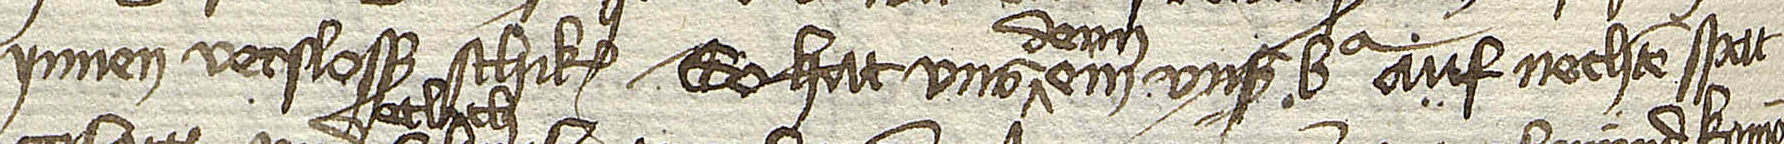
ynnen verſloſſ* ſchik* / So hat vns ein vnſ* B* auf nechte* ſpat
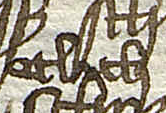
etlich
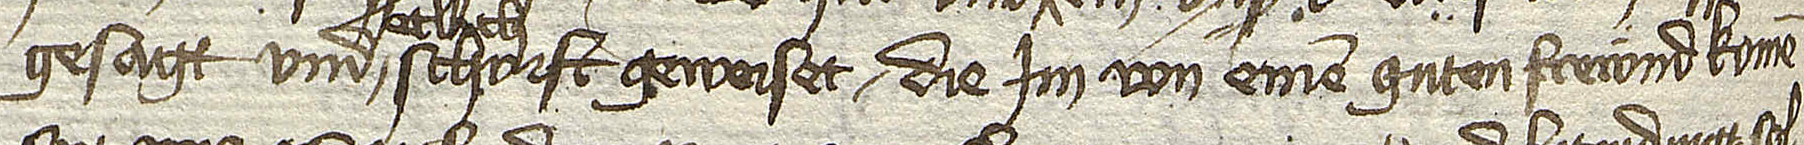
geſagt vnd ſchrift geweiſet / die Im von eine* guten frewnd kome*
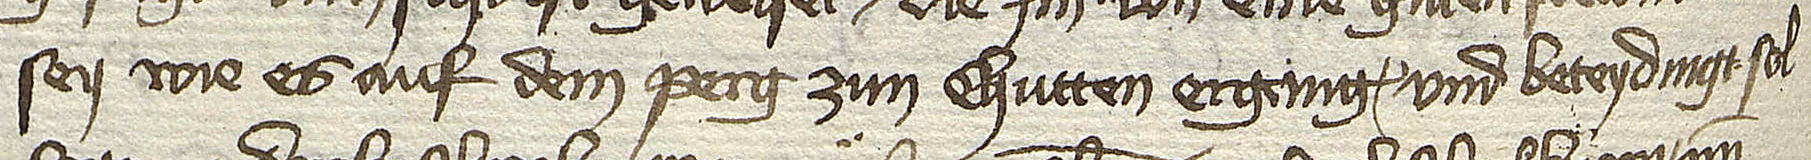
ſey wie es auf dem perg ʒun Chutten erging* vnd beteydingt . ſol
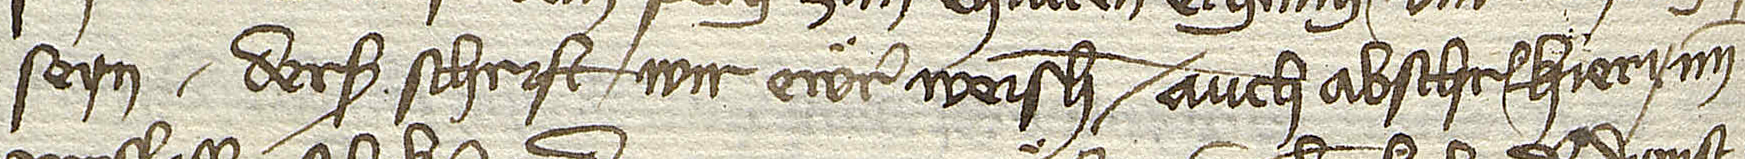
ſeyn / derſ* ſchrift wir ew*r weiſh* / auch abſchr* hierynn*
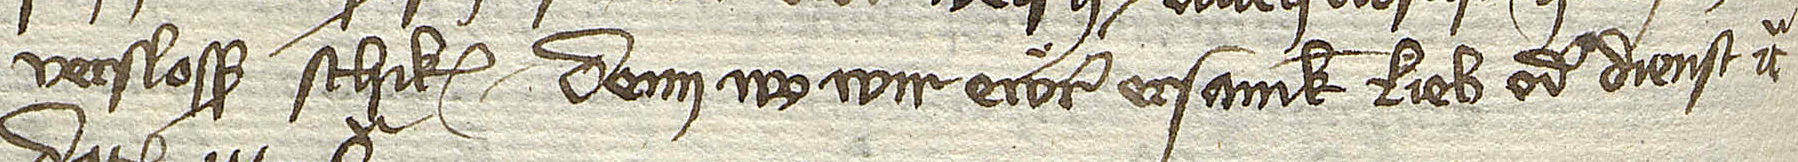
verſloſſ* ſchik* / Denn wo wir ewr* erſamk* lieb od* dienſt ec*
